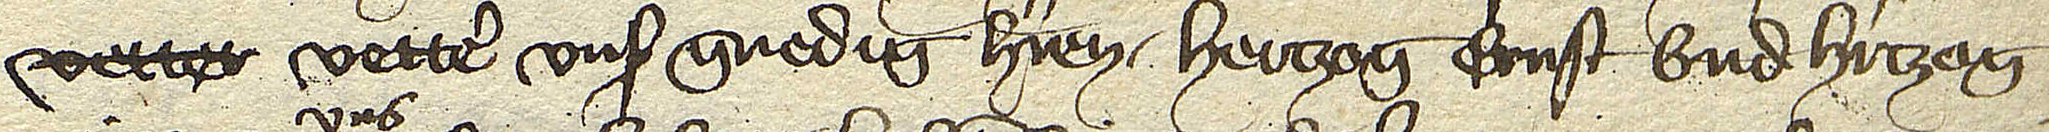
vetter vette* vnſ* gnedig hr*en / hercʒog Ernſt vnd h*rcʒog
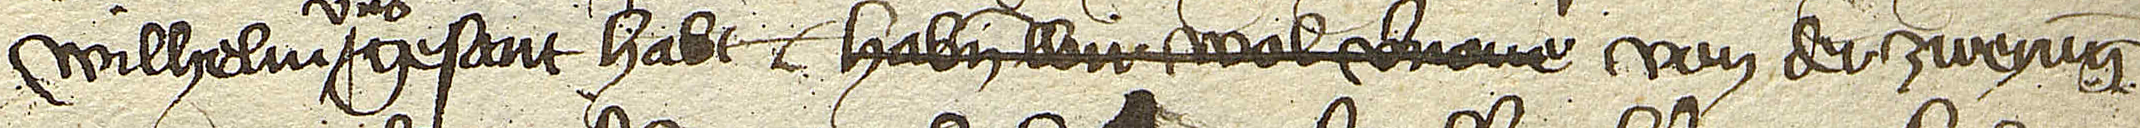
wilhelm geſant habt / habn* wir wol v*nome von der cʒweyug*
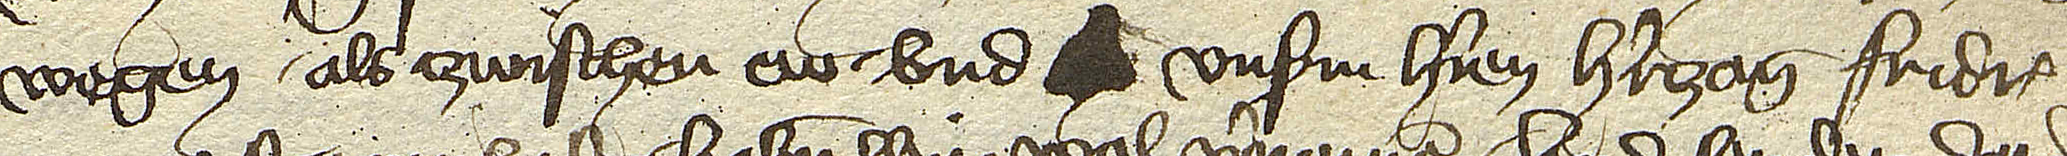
wegen / als cʒwiſchen ew / vnd vnſ*m hr*en h*cʒog fridr*
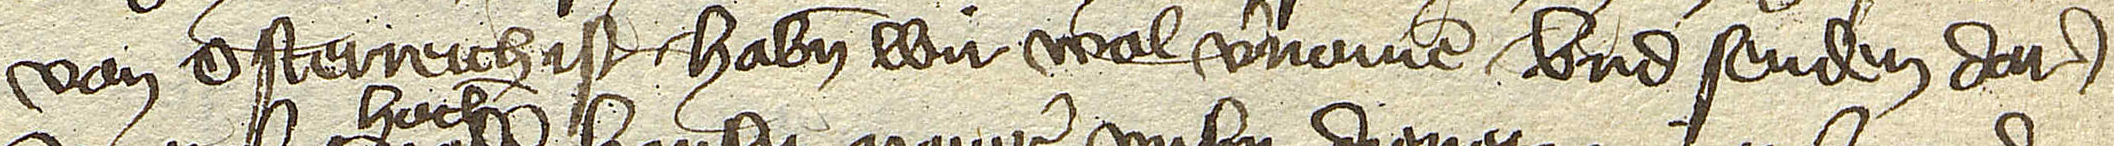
von Oſterreich iſt / habn* wir wol v*nome* / vnd ſenden dar*
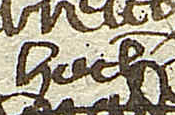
hoch*
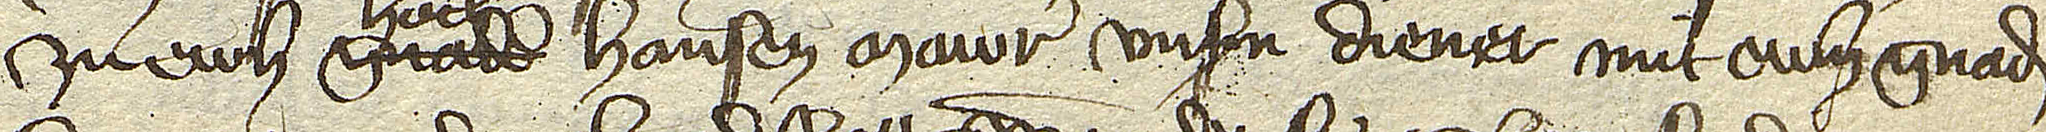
cʒu ewn* gnade* Hanſen Mawr* vnſ*n diener mit ewn* gnad*
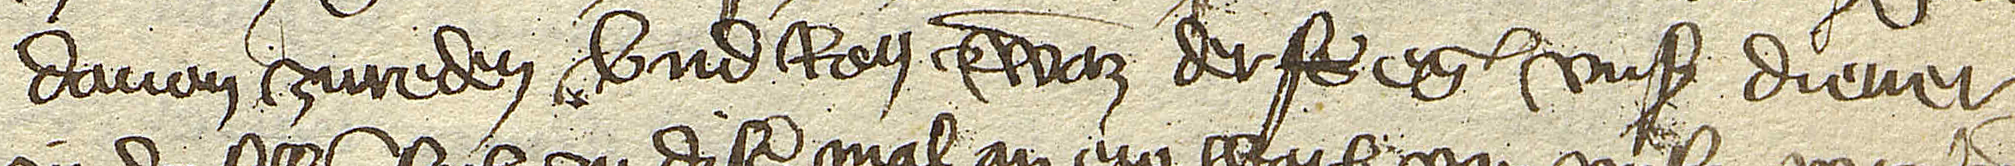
dauon cʒureden / vnd Ro* waʒ der ſe eg* vnſ* diener
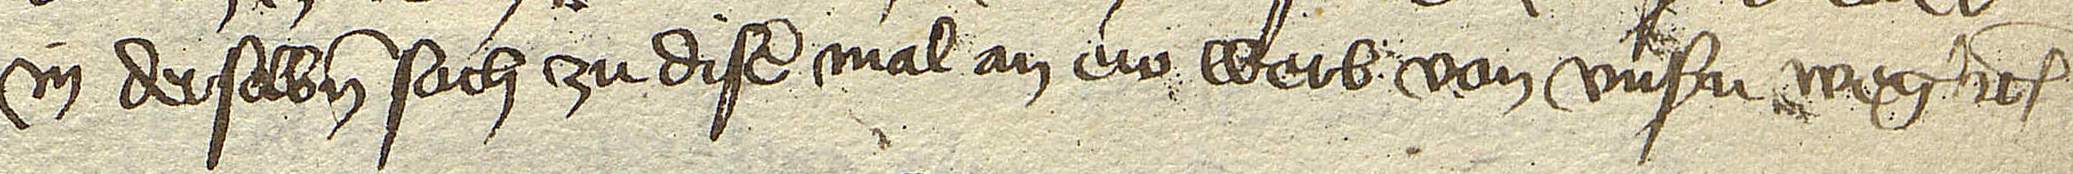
in derſelbn* ſach cʒu diſe* mal an ew werb von vnſ*n weg* ec*
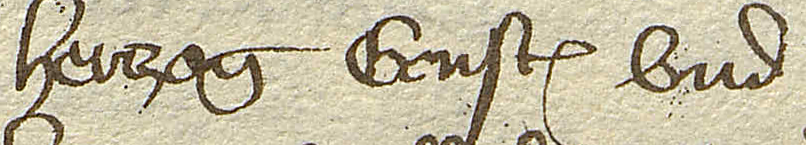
hercʒog Ernſt* vnd
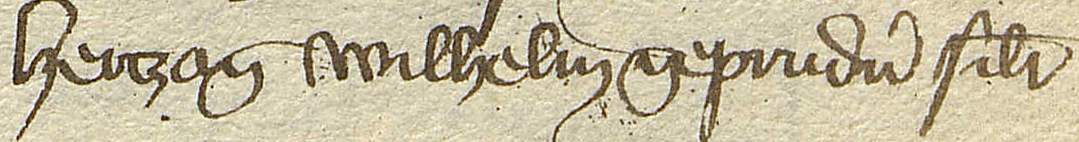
hercʒog wilhelm geprudn* ſilr*
